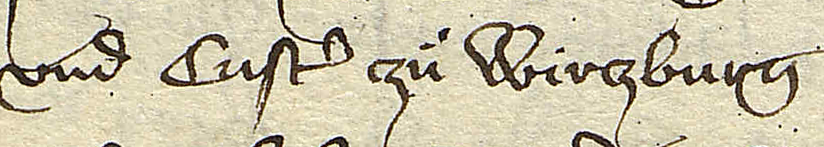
vnd Cuſt cʒü Wircʒburg
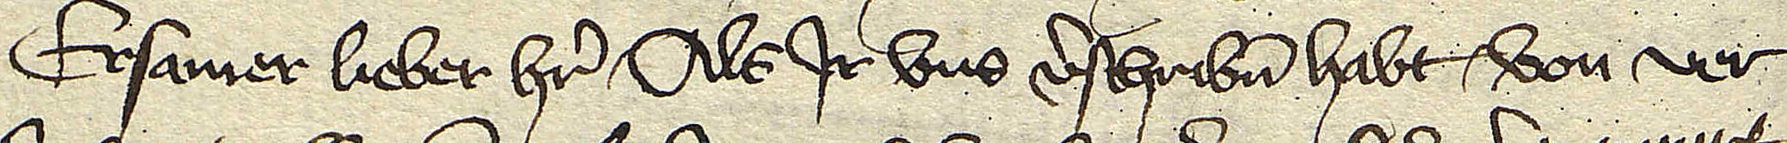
Erſamer lieber hr* / Als Ir vns v*ſchribn* habt / von ver
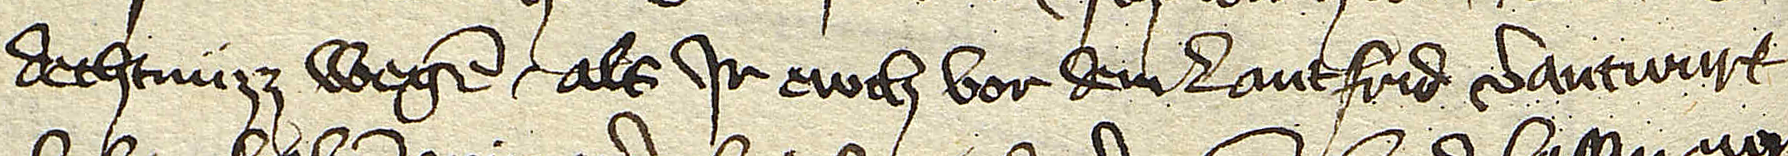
dechtnüʒʒ wege* / als Ir ewch vor dem Lantfrid v*antwurt
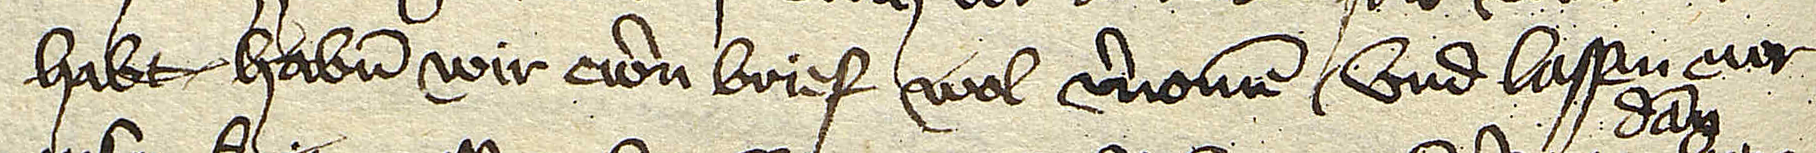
habt / habn* wir ew*n brief wol v*nome* / vnd laſſen ewr
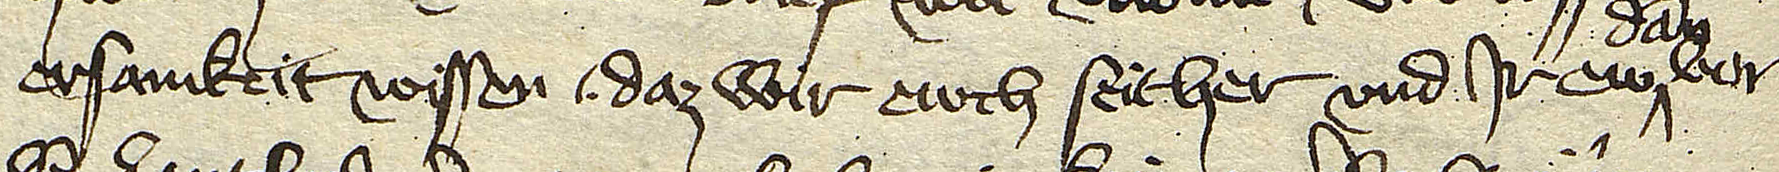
erſamkeit wiſſen / . daʒ wir ewch ſeither vnd Ir ew vor
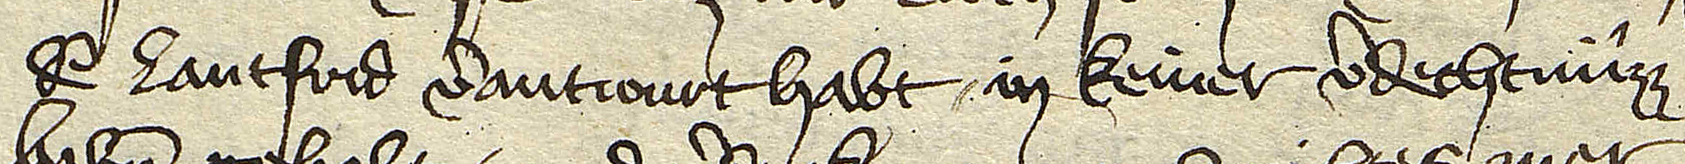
d* Lantfrid v*antwurt habt / in keiner v*dechtnüʒʒ
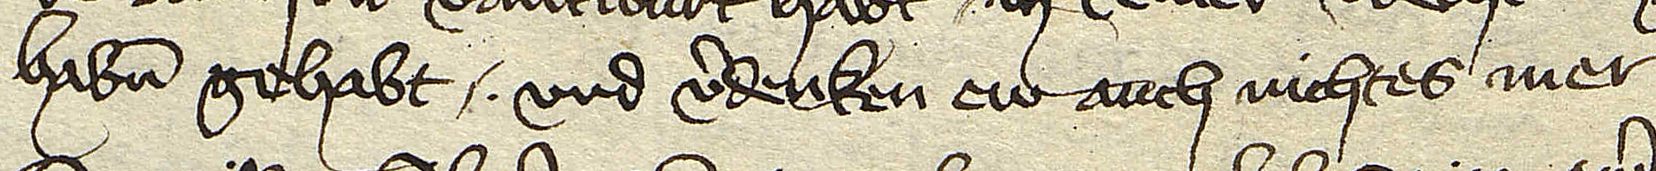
habn* gehabt / . vnd v*denken ew auch nichtes mer
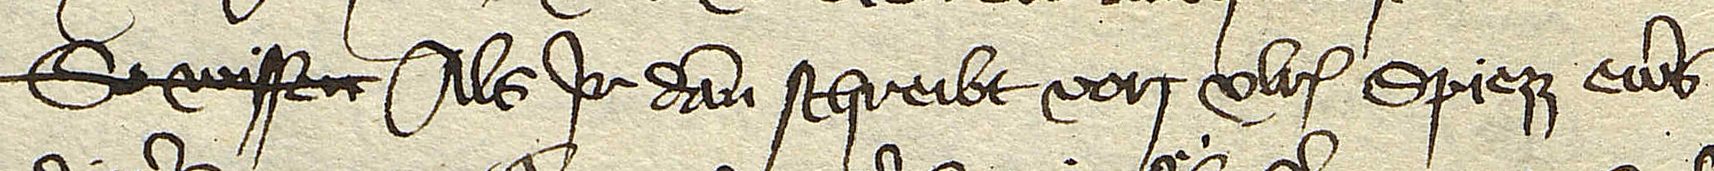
So wiſſen Als Ir dan* ſchreibt von vlr* Spieʒʒ ew*s
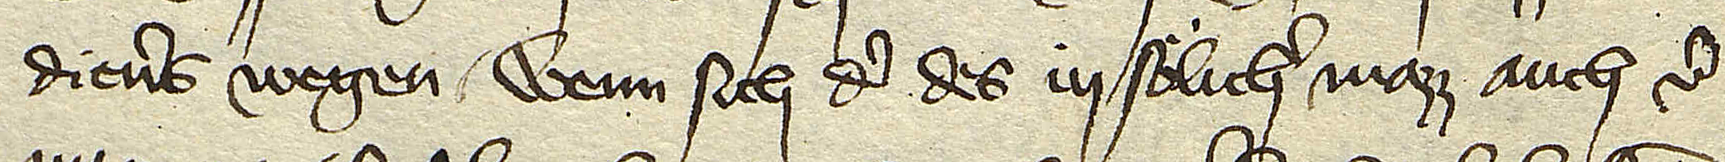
dien*s wegen / wenn ſich d* des in ſölich* maʒʒ auch v*
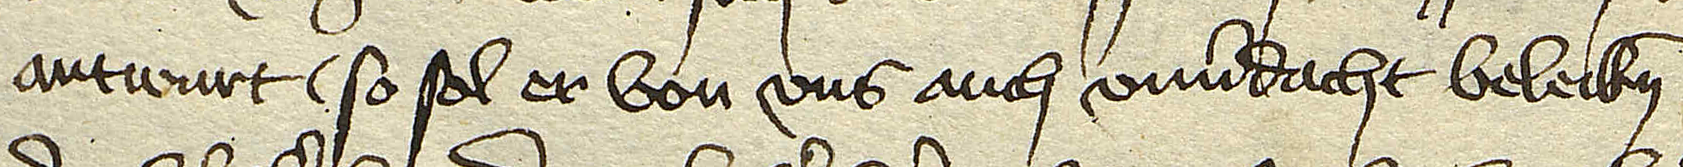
antwurt / ſo ſol er von vns auch vnu*dacht beleibn*
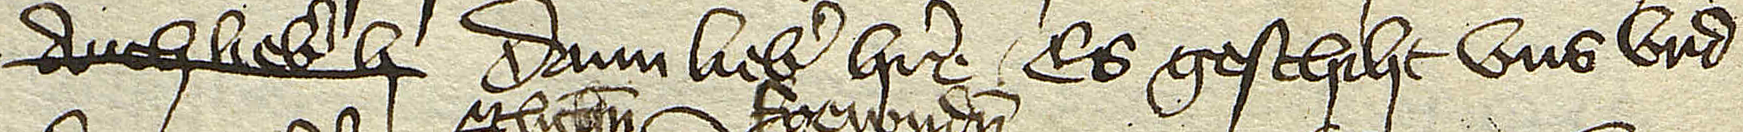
Auch lieb* h Dann lieb* hr*e / Es geſchiht vns vnd
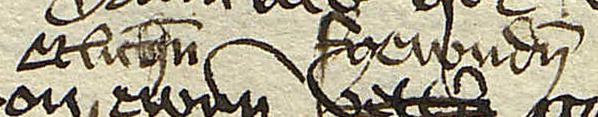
etlichn* frewndn*
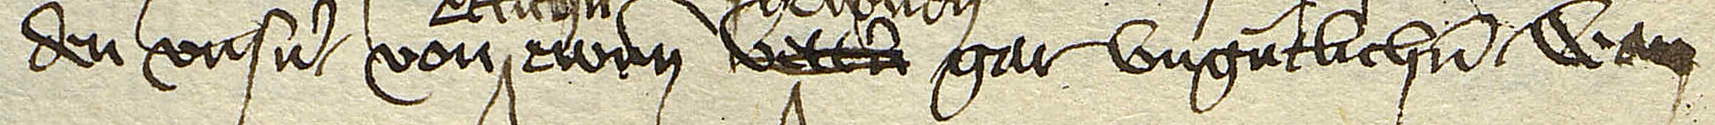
den vnſn* / von ewr*n vett*n gar vngütlichn* / wan
